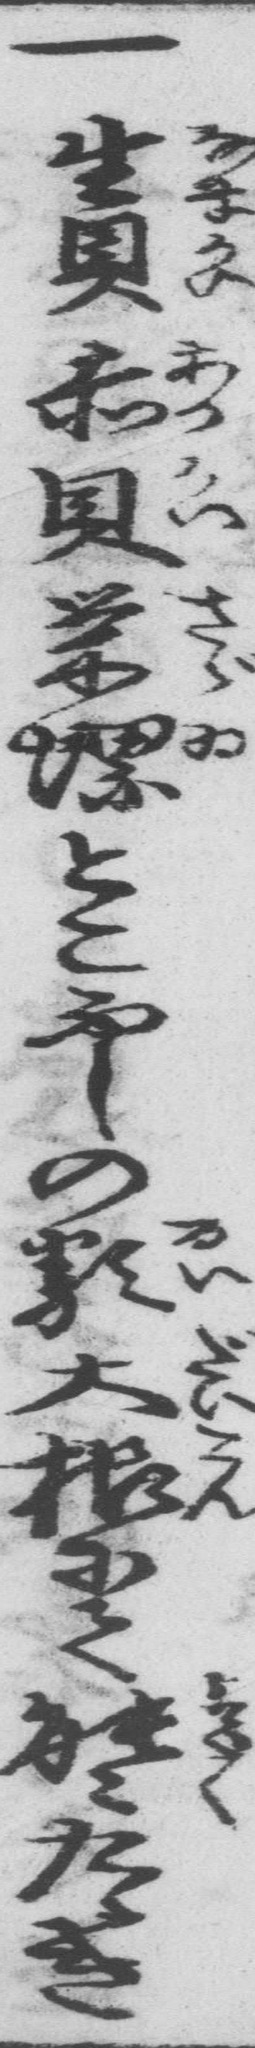一生貝赤貝栄螺とこふしの類大根にて能々たゝき
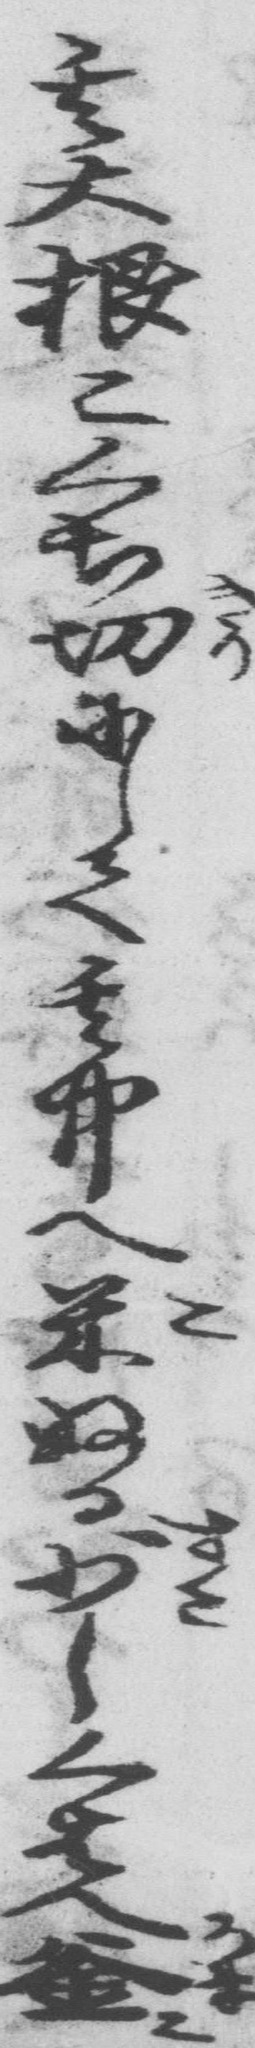其大根こくち切にして其へ米ぬか少しくはへ釜
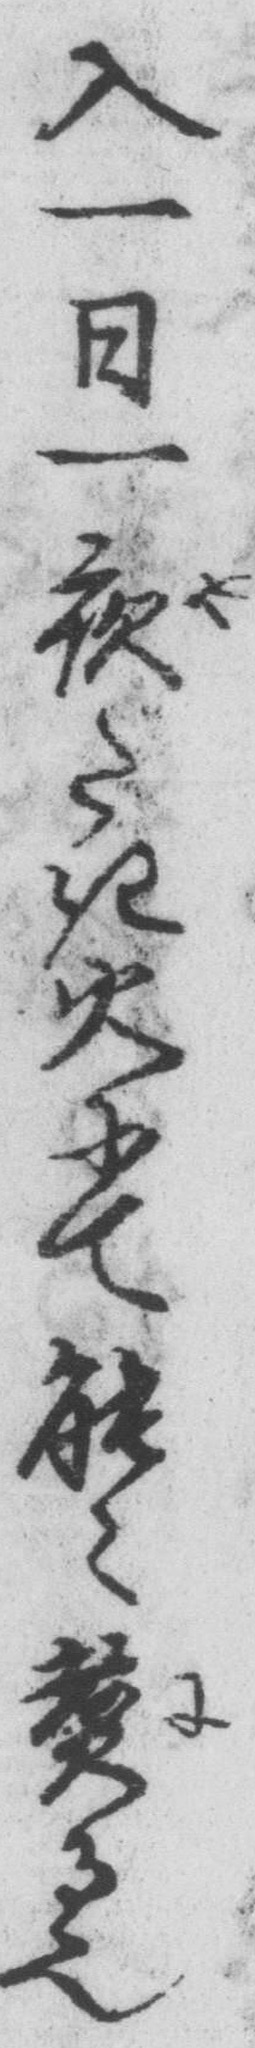入一日一夜たき火にて能々煮る也

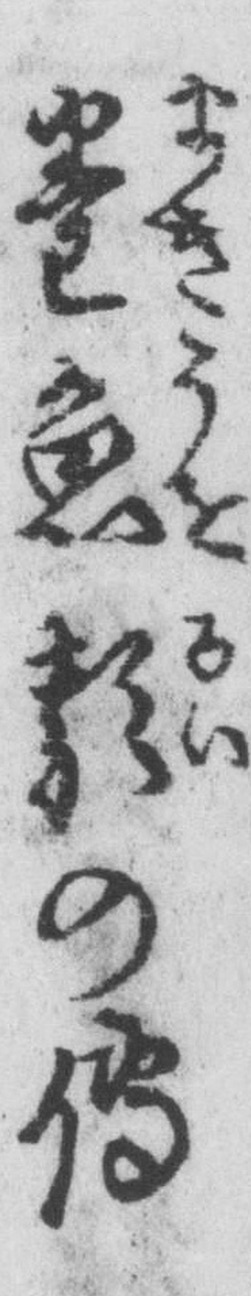巻魚類の傳
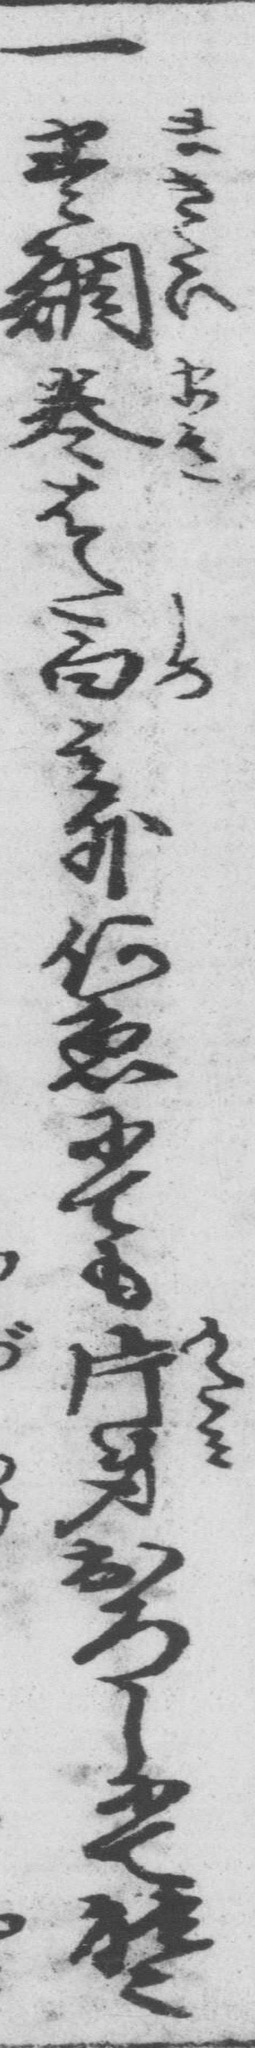一巻鯛巻はた白其外何魚にても片身おろしにて能々
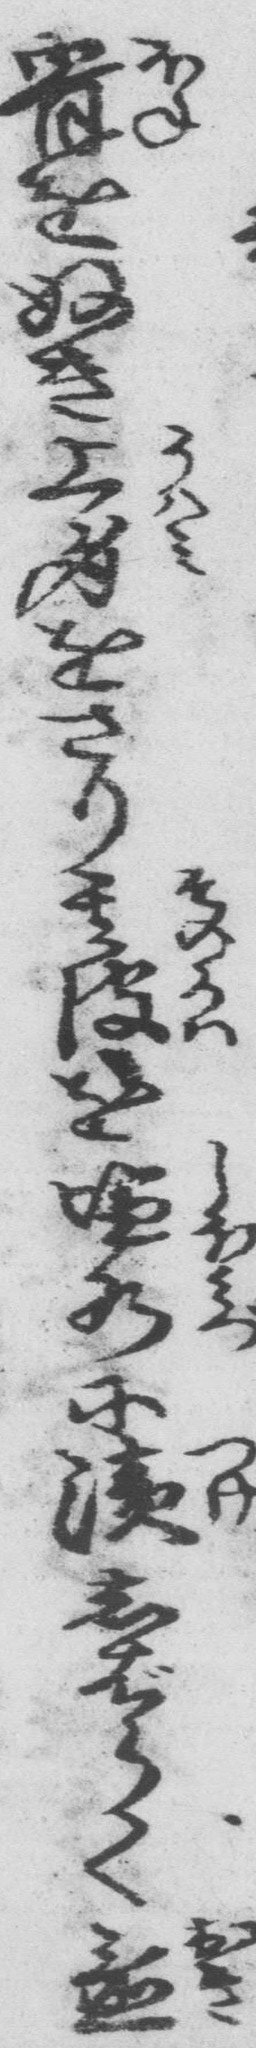骨をぬき上身をさり其皮塩水に漬しばらく置
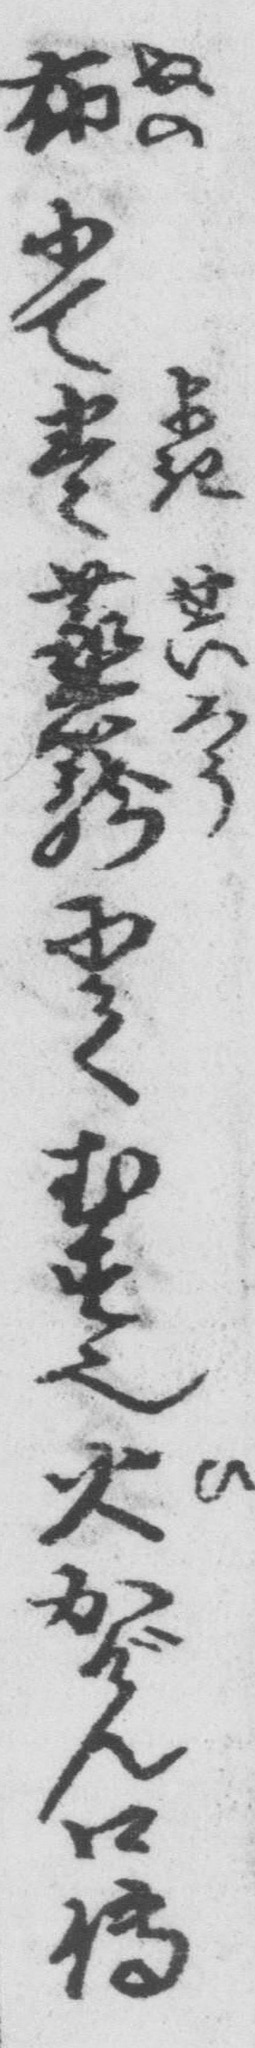布にて能蒸籠にてむす也火かげん口傳
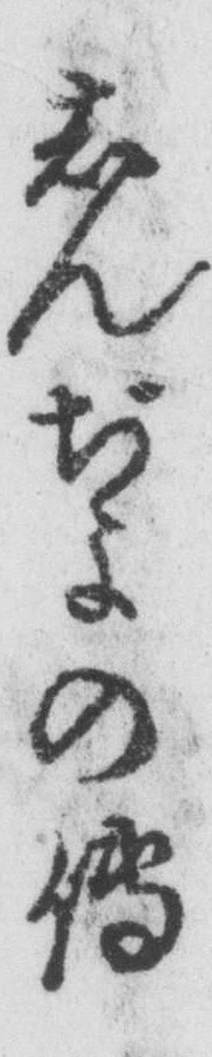しんじよの傳
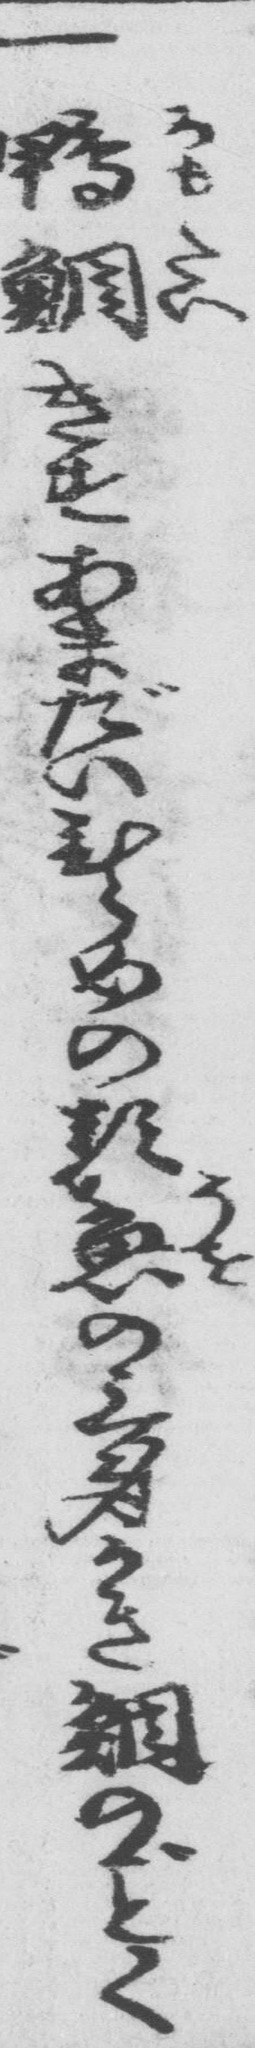一鴨鯛きすあまだいひらめの類魚の身かき鯛のごとく
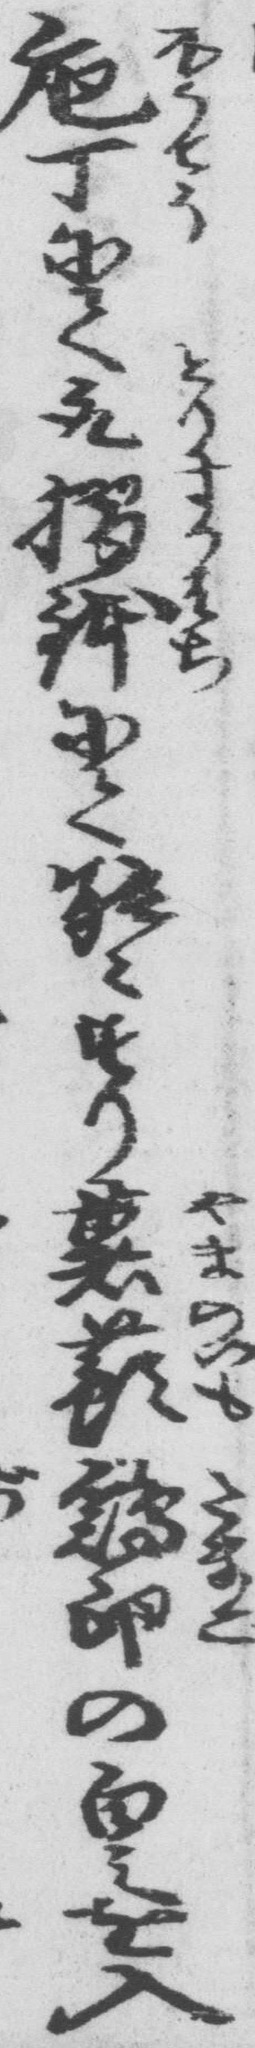庖丁にて取摺鉢にて能々すり薯蕷鶏卵の白ミを入
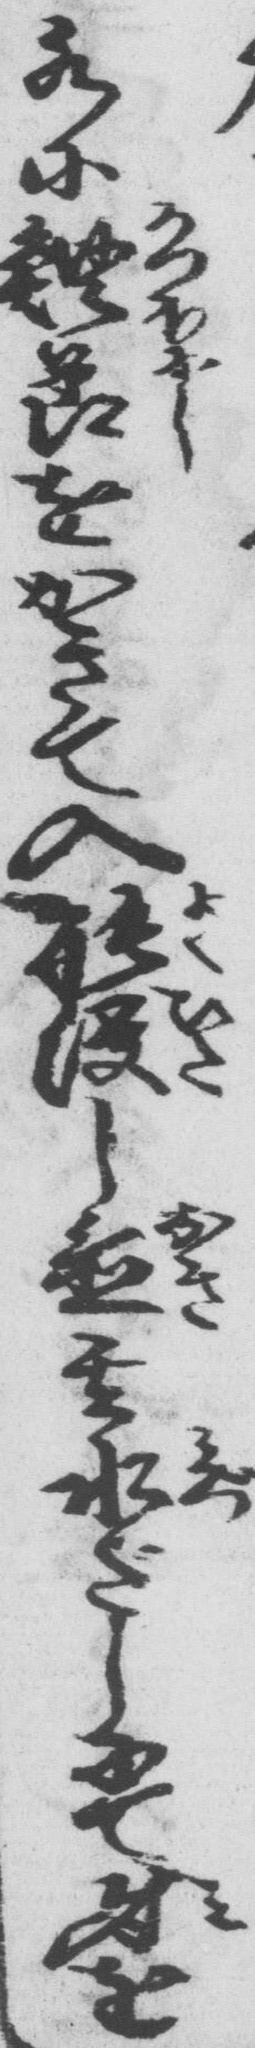水に鰹節をかきて入能浸し置水ざしにて身を
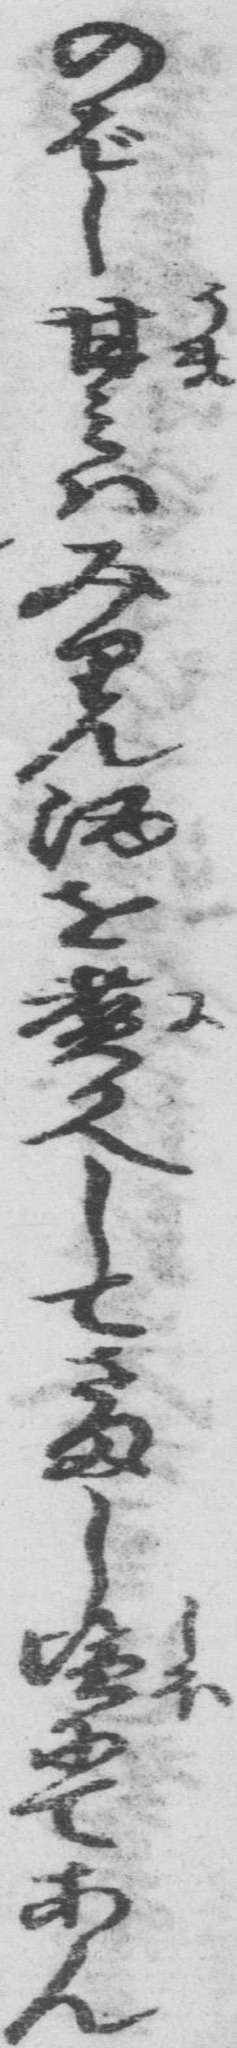のばし甘ミハみりん酒を煮かへしてさまし塩にてあん
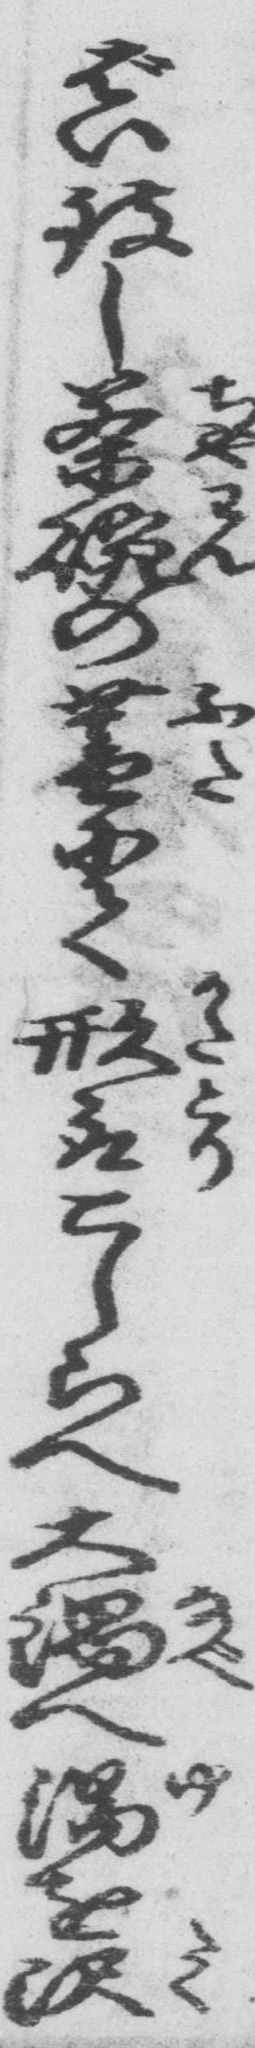ばいし茶碗の蓋にて形取こしらへ大鍋へ湯を沢
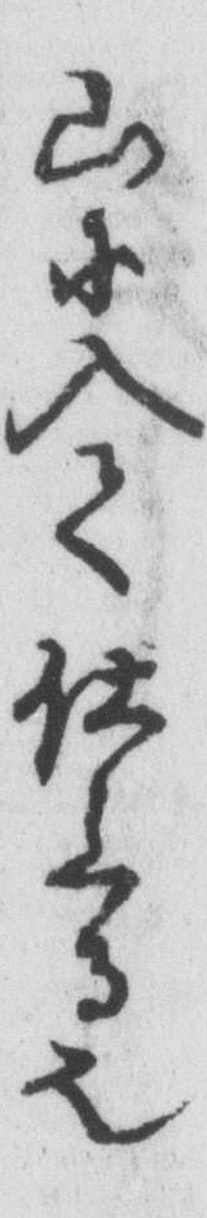山入れて仕立る也
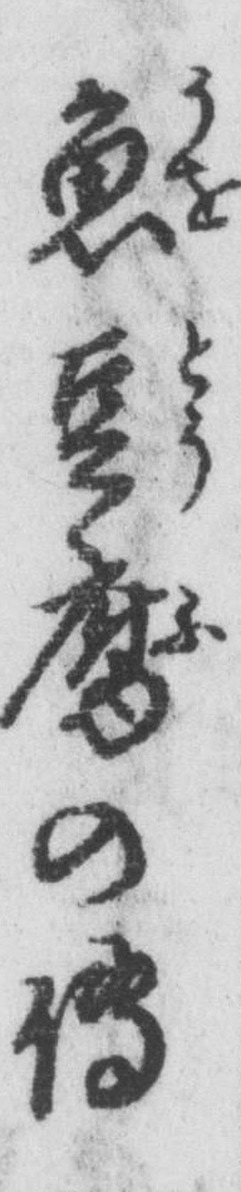魚豆腐の傳
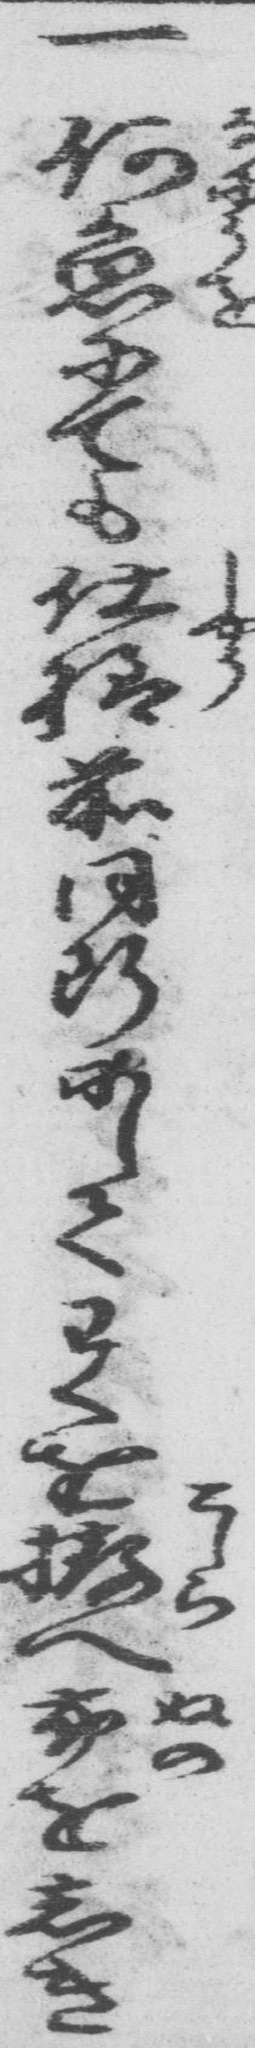一何魚にても仕様前同段にしてわくを拵へ布をしき
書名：当世料理献立
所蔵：大阪府立大学学術情報センター 国文学研究資料館
